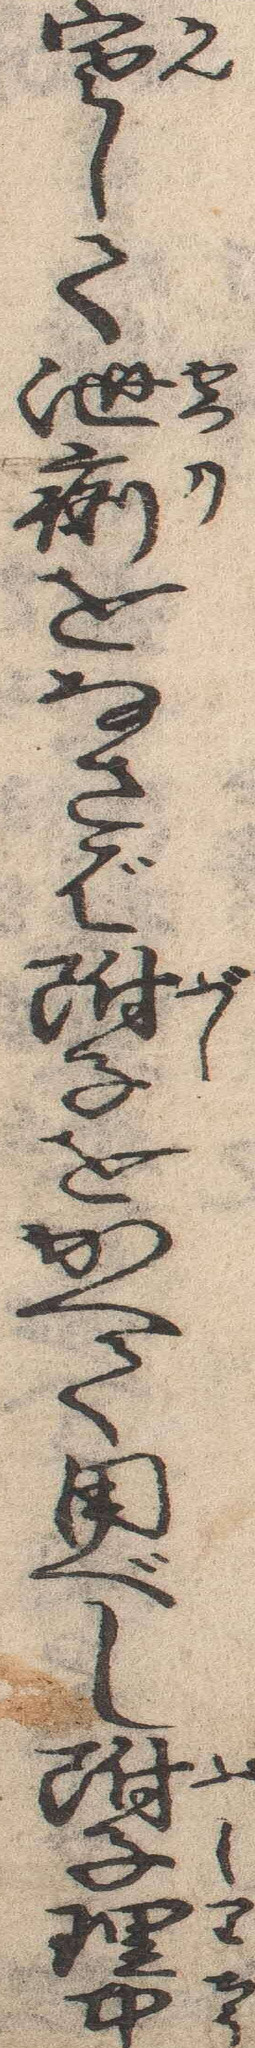寒して泄痢をなさば附子をかへて用べし附子理中

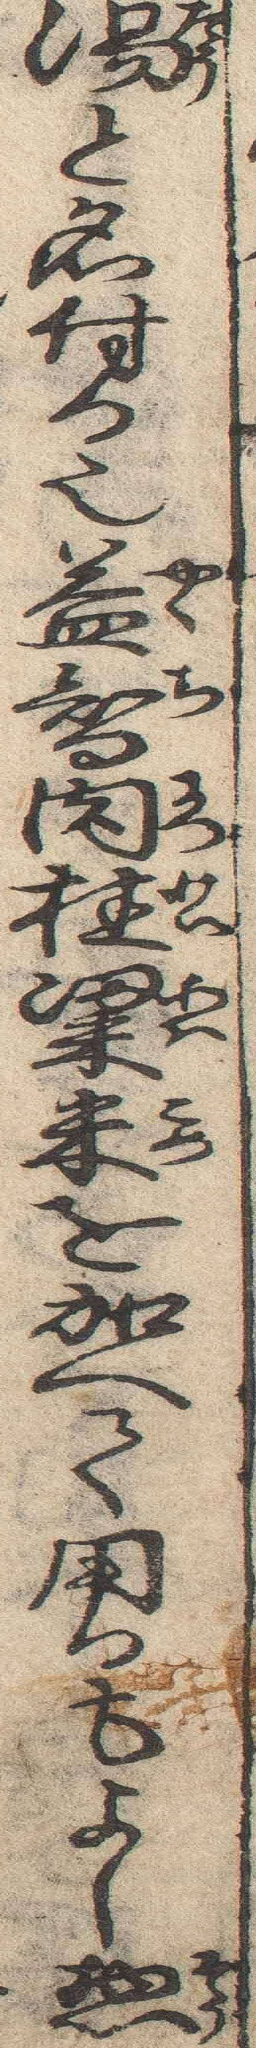湯と名付る也益智肉桂粱米を加へて用るもよし総
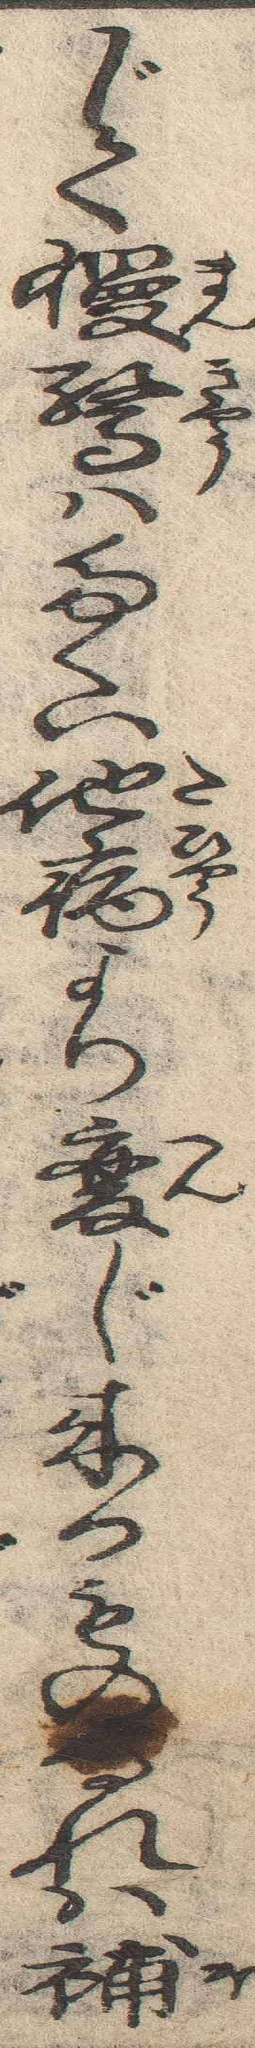じて慢驚は多くは他病より変じ来るものなれは補
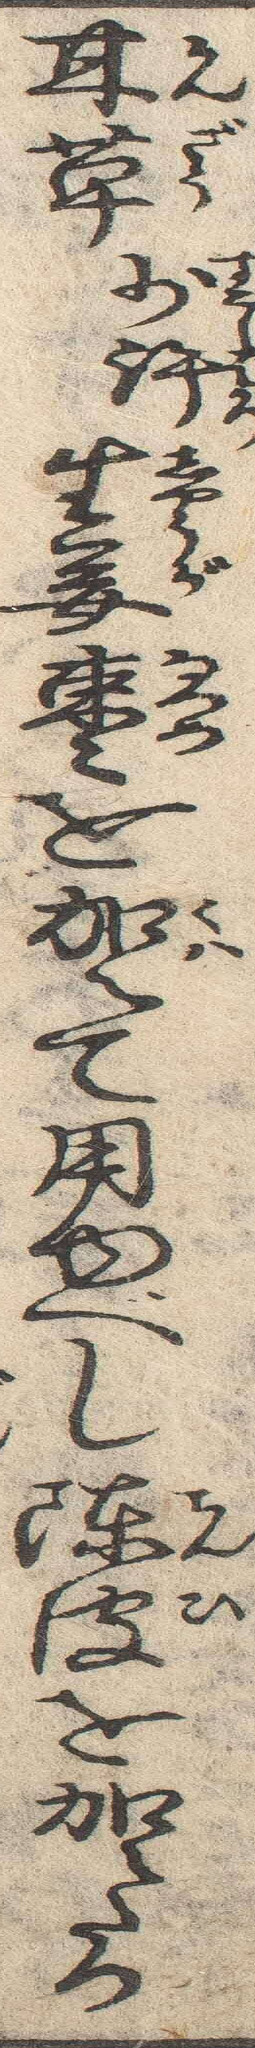甘草少許生姜棗を加えて用ゆべし陳皮を加えたる
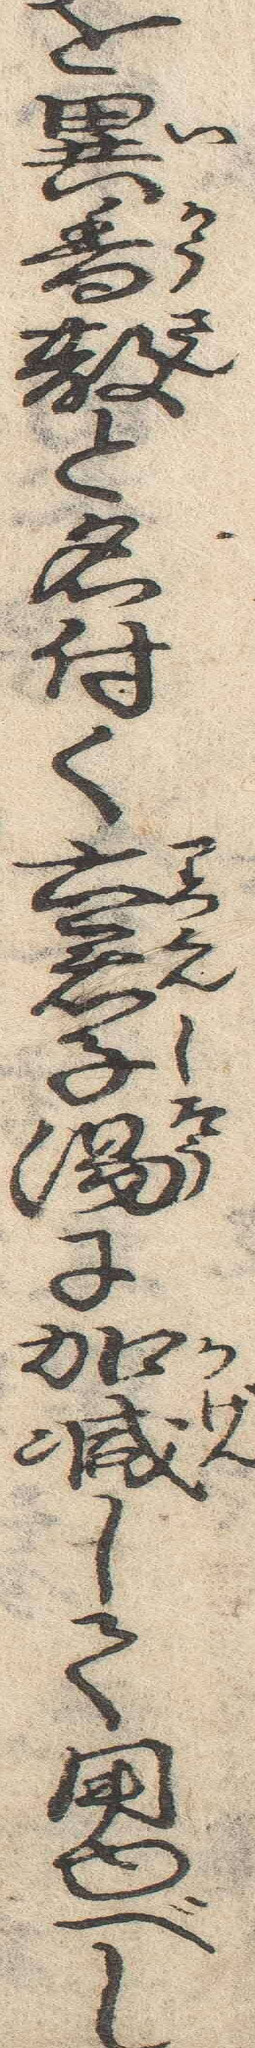を異香散と名付く六君子湯に加減して用ゆべし
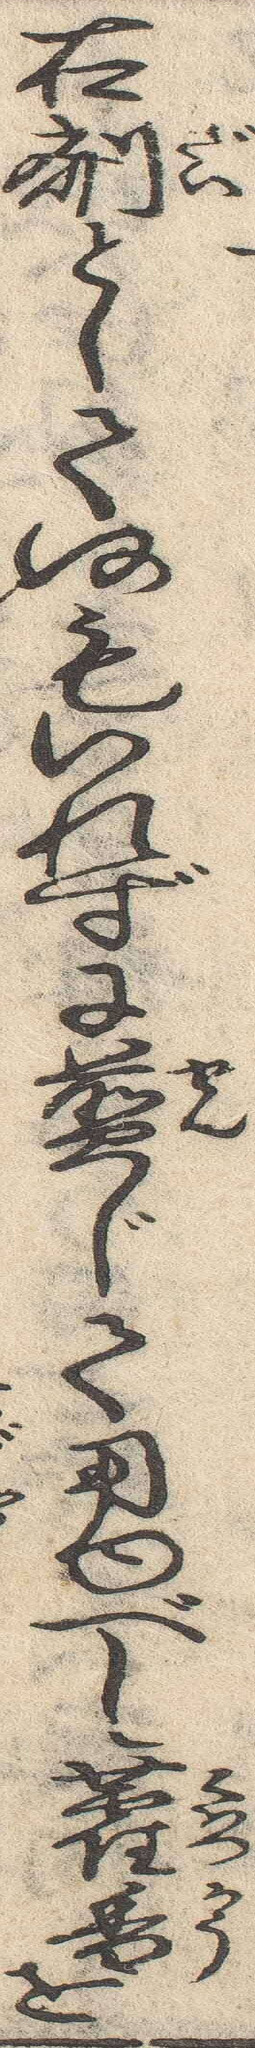右剤として何もいれずに煎じて用ゆべし藿香を
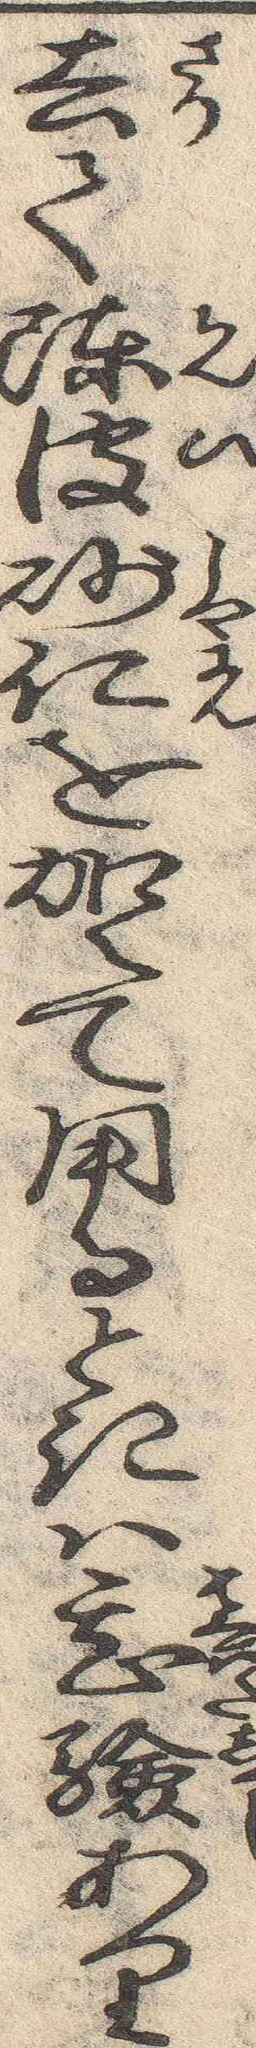去て陳皮砂仁を加えて用るときは甚験あり
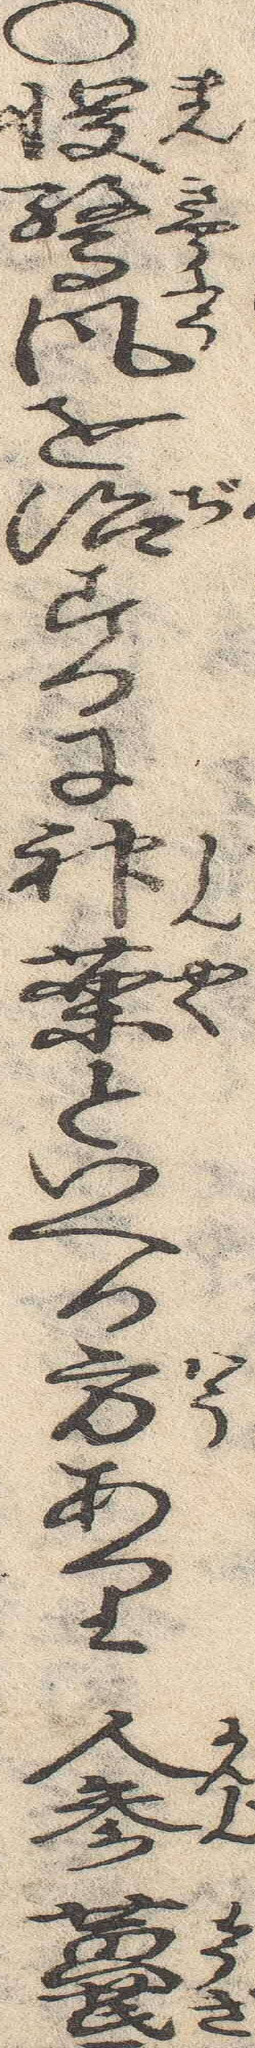○慢驚風を治するに神薬といへる方あり人参黄茋
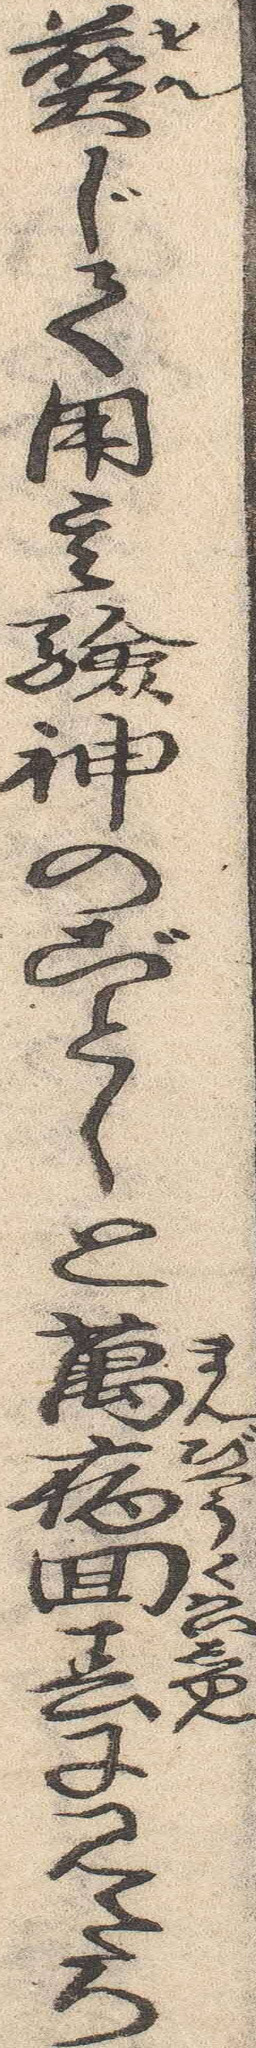煎じて用其験神のごとしと万病回春に見えたり
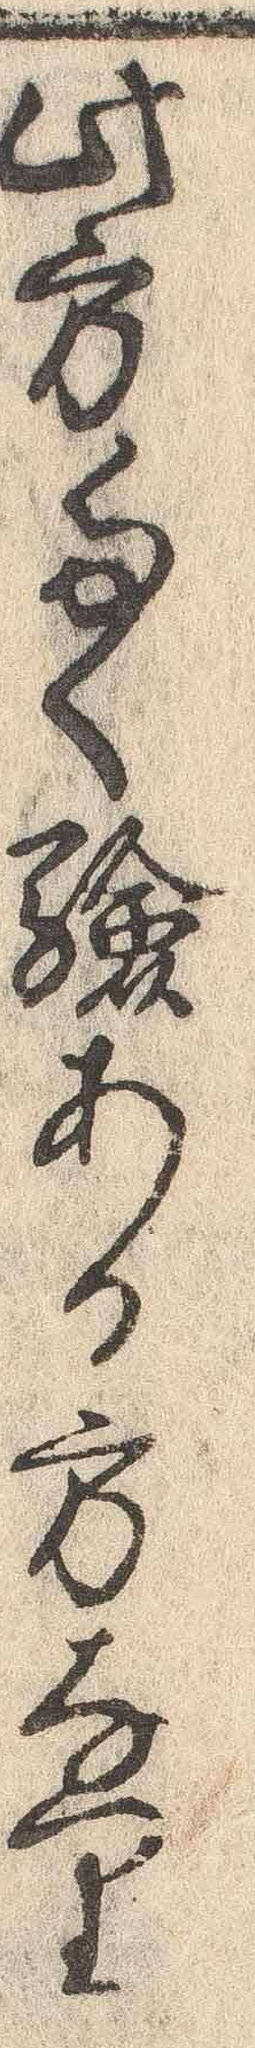此方多く験ある方なり
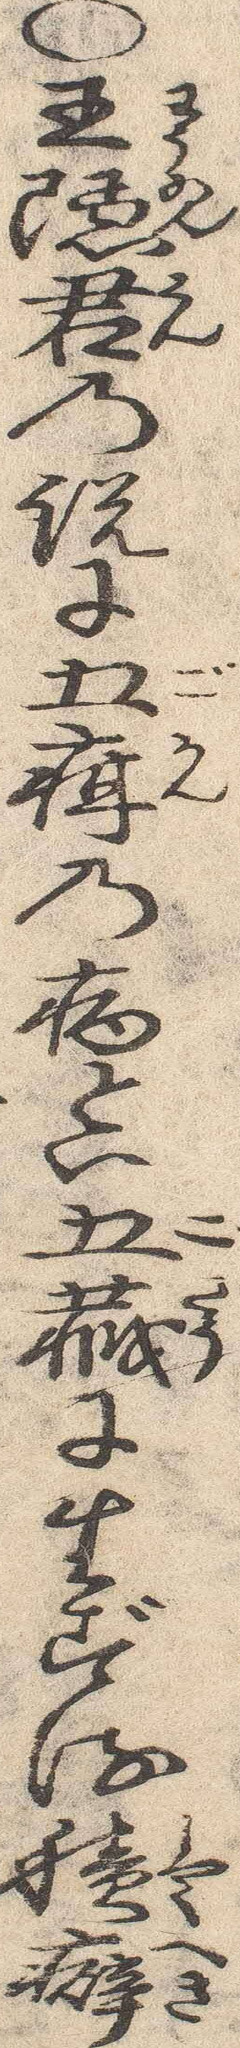○王隠君の説に五疳の病とは五蔵に生ずる積癖
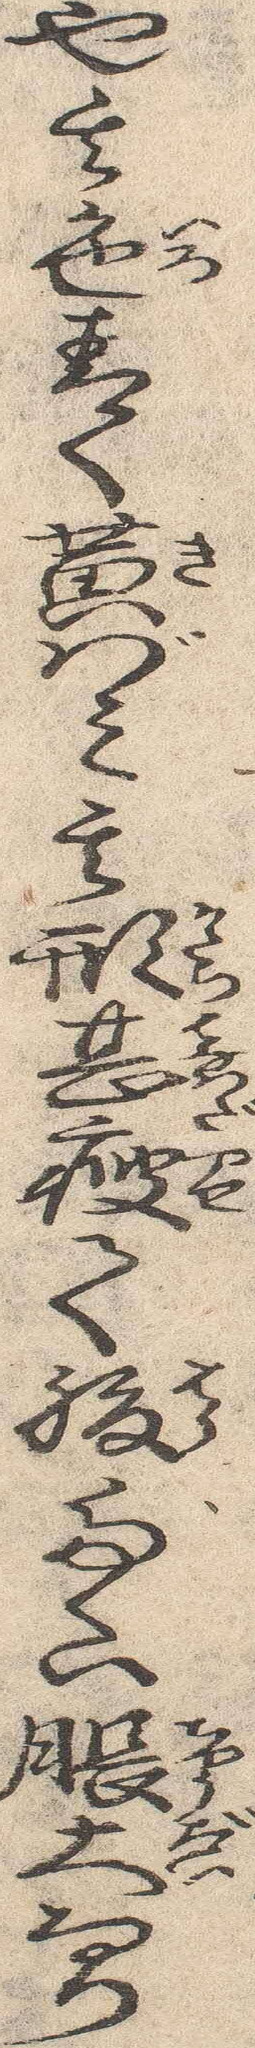也其色青く黄ばみ其形甚瘦て腹多くは脹大なり
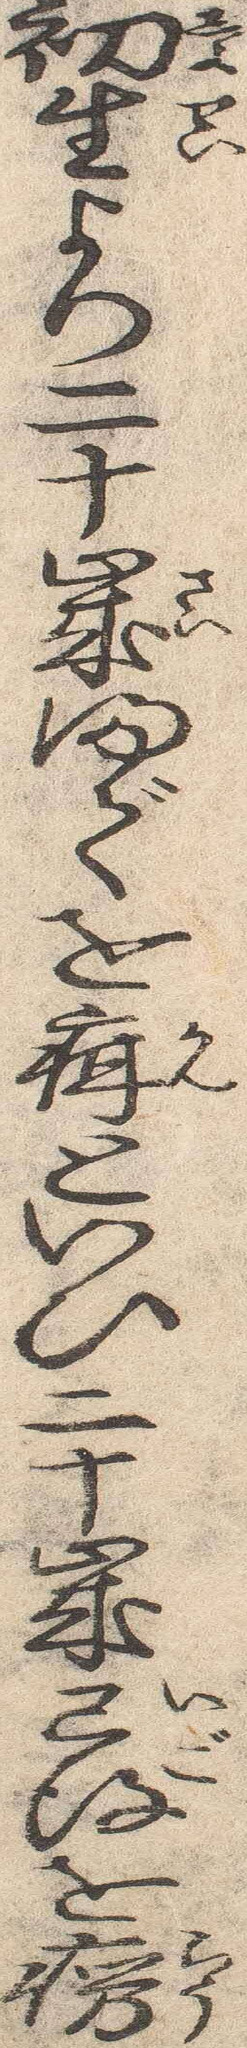初生より二十歳までを疳といひ二十歳已後を癆
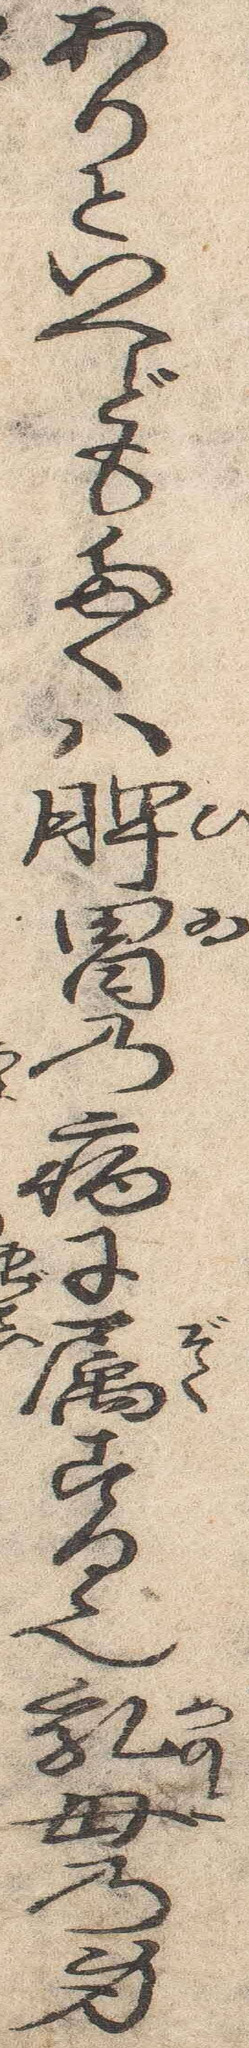ありといへども多くは脾胃の病に属する也乳母の身
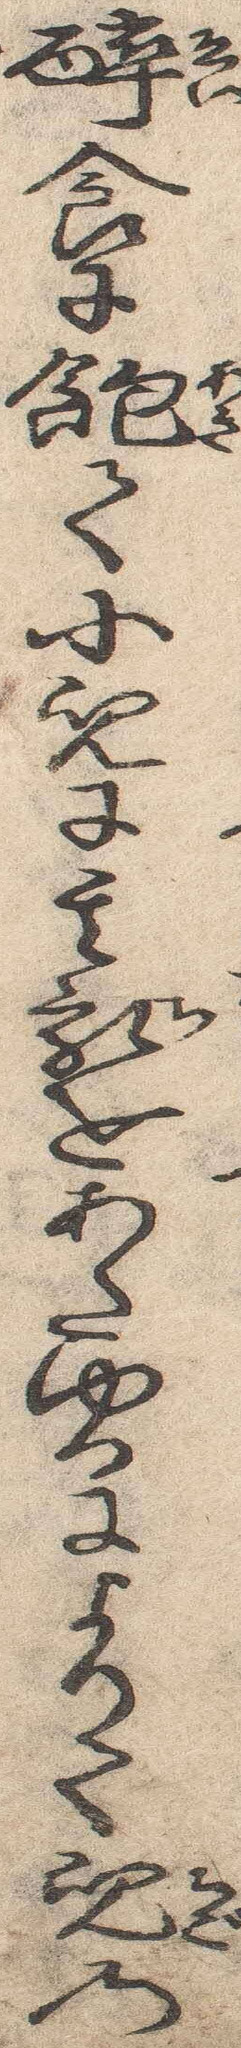醉食に飽て小児に其乳をあたゆるによりて児の
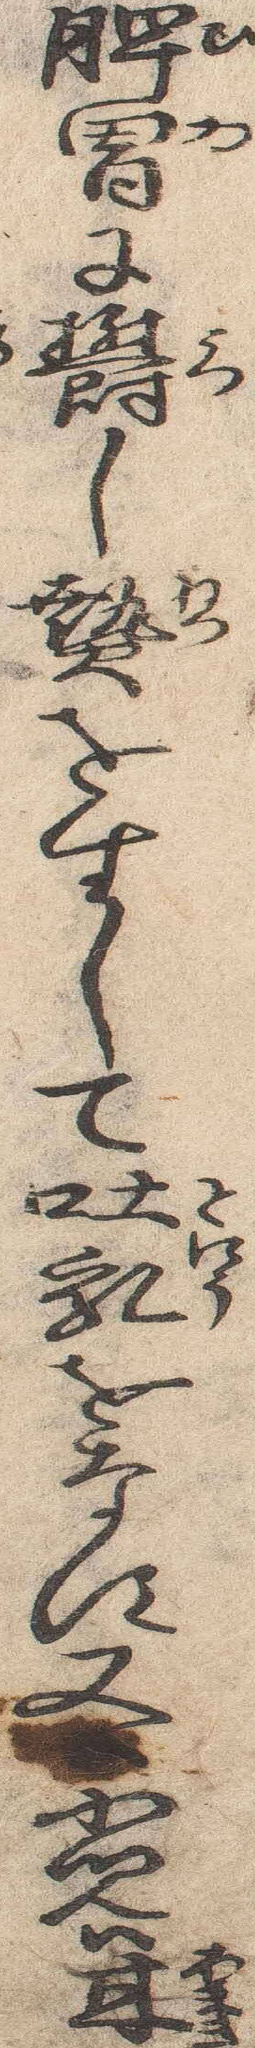脾胃に鬱し熱を生して吐乳をなす又小児は甘
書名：小児必用養育草
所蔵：東京学芸大学附属図書館 国文学研究資料館
